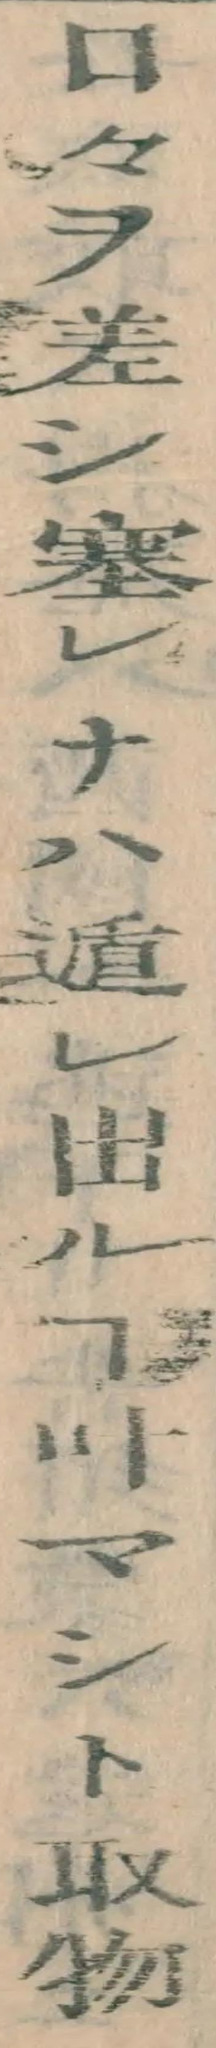口々ヲ差シ塞レナハ遁レ出ルヿ叶マシト取物

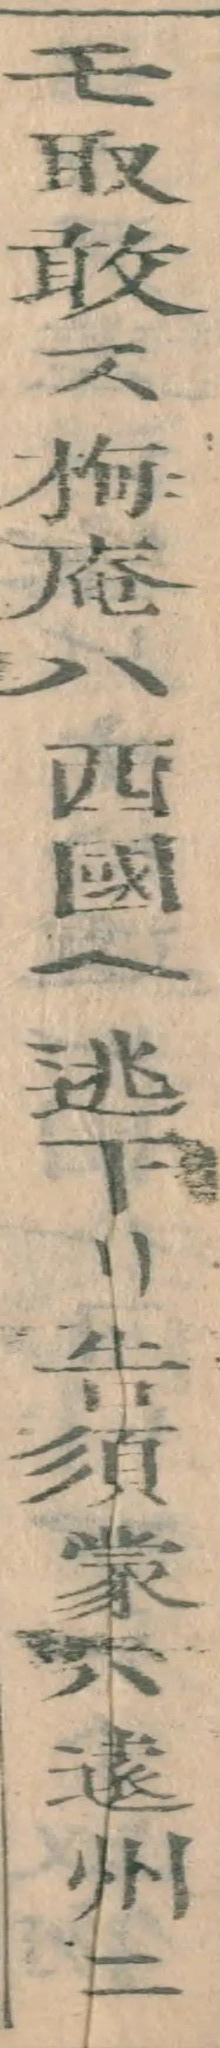モ取敢ス梅庵ハ西国ヘ逃下リ告須蒙ハ遠州ニ
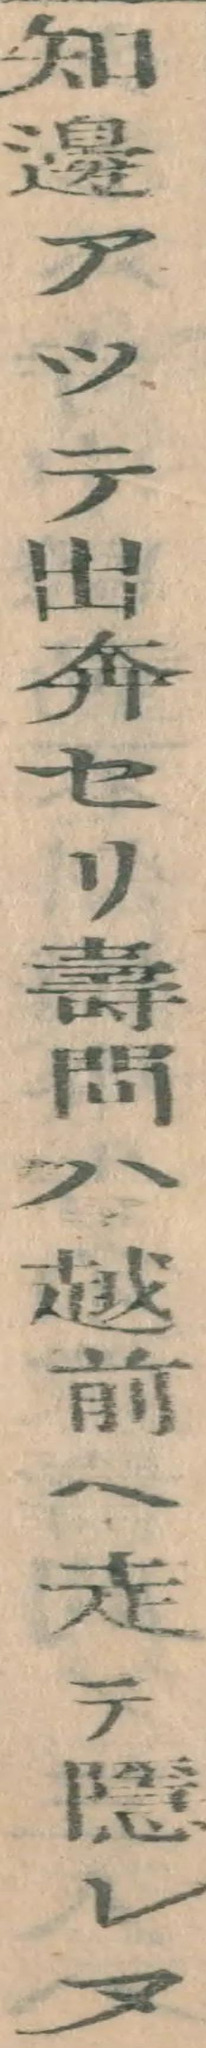知辺アツテ出奔セリ寿問ハ越前ヘ走テ隠レヌ
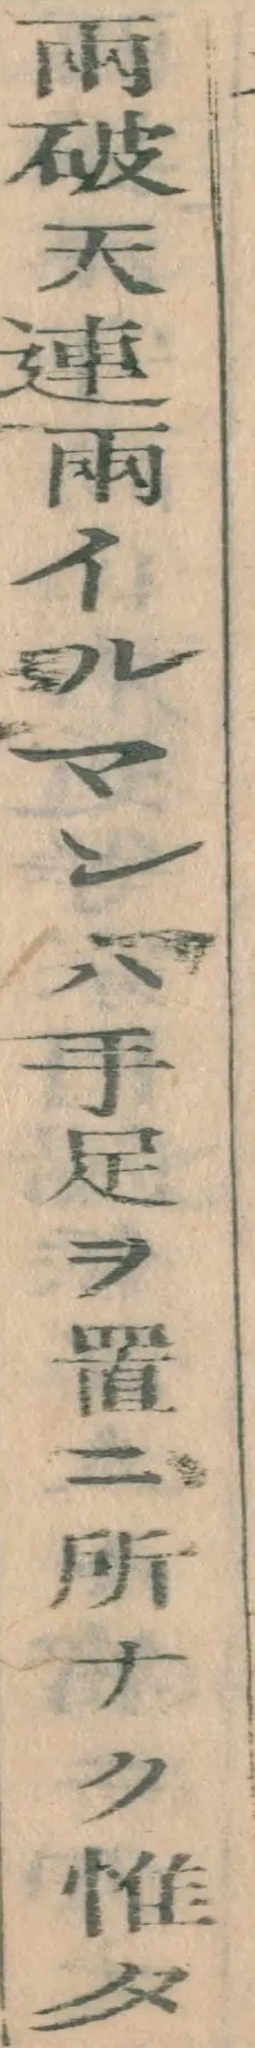両破天連両イルマンハ手足ヲ置ニ所ナク惟タ
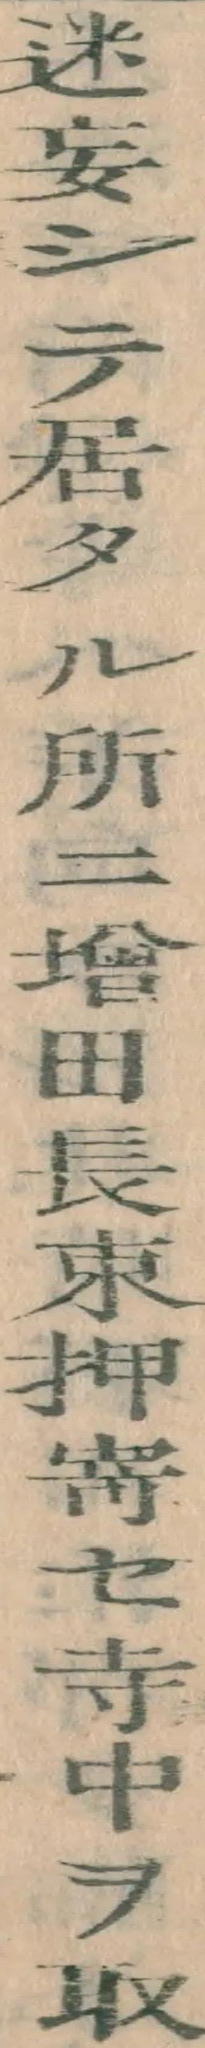迷妄シテ居タル所ニ増田長束押寄セ寺中ヲ取
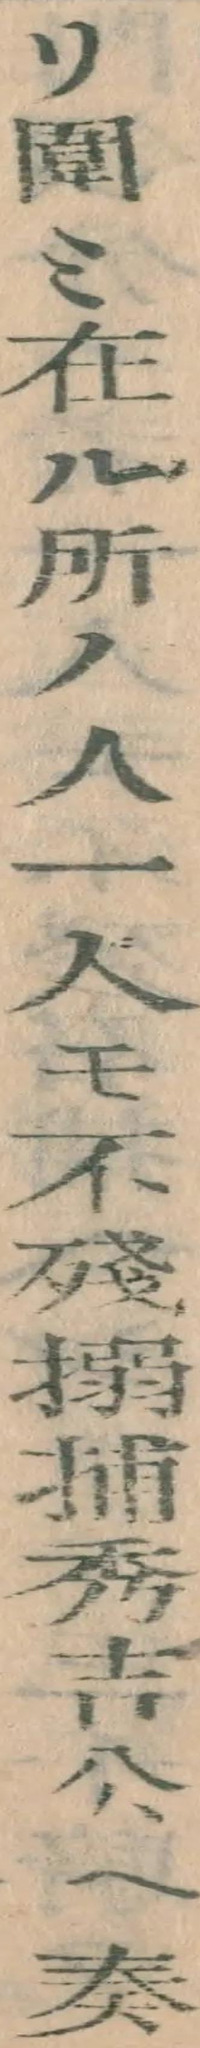リ囲ミ在ル所ノ人一人モ不残搦捕秀吉公ヘ奏
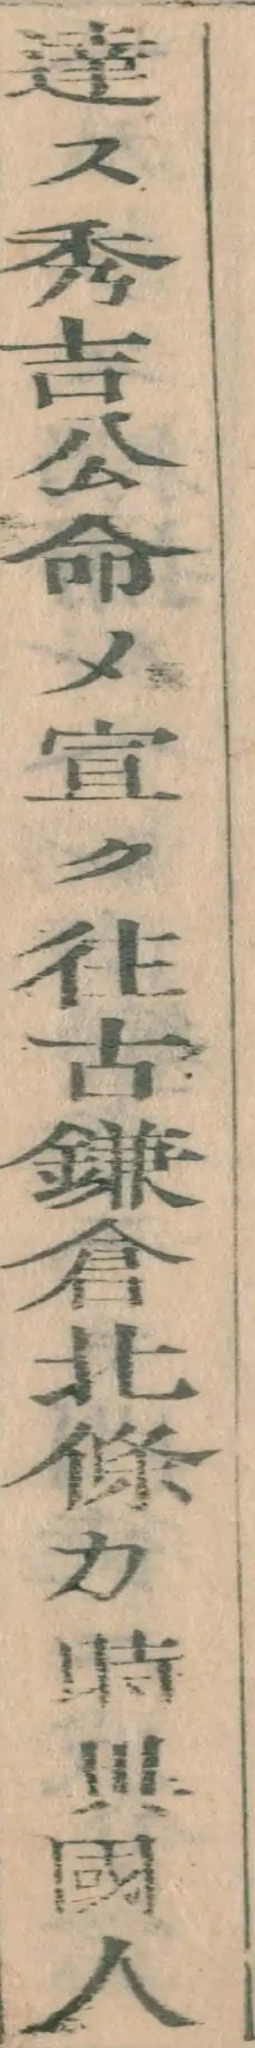達ス秀吉公命シテ宜ク往古鎌倉北条カ時異国人
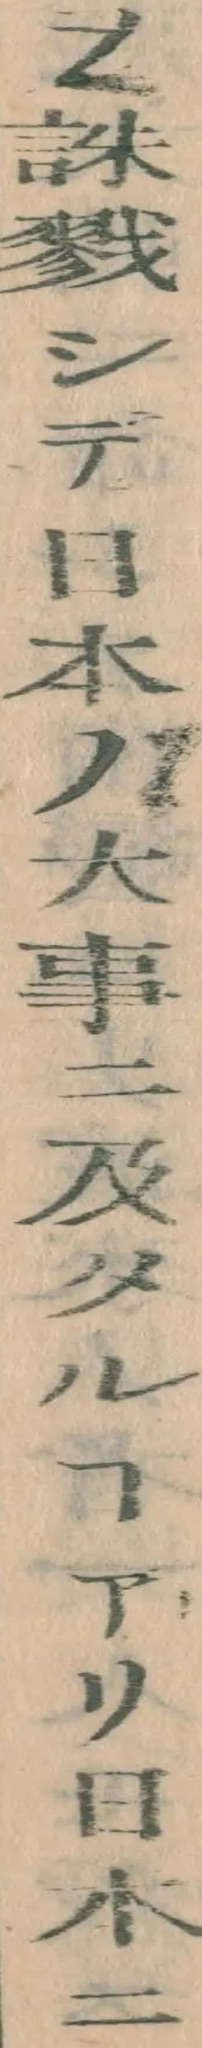ヲ誅戮シテ日本ノ大事ニ及タルヿアリ日本ニ
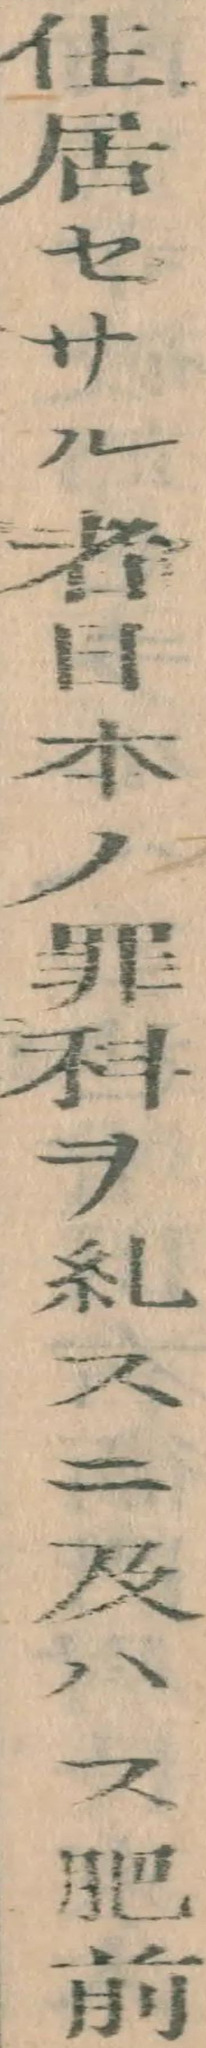住居セサル者日本ノ罪科ヲ糺スニ及ハス肥前
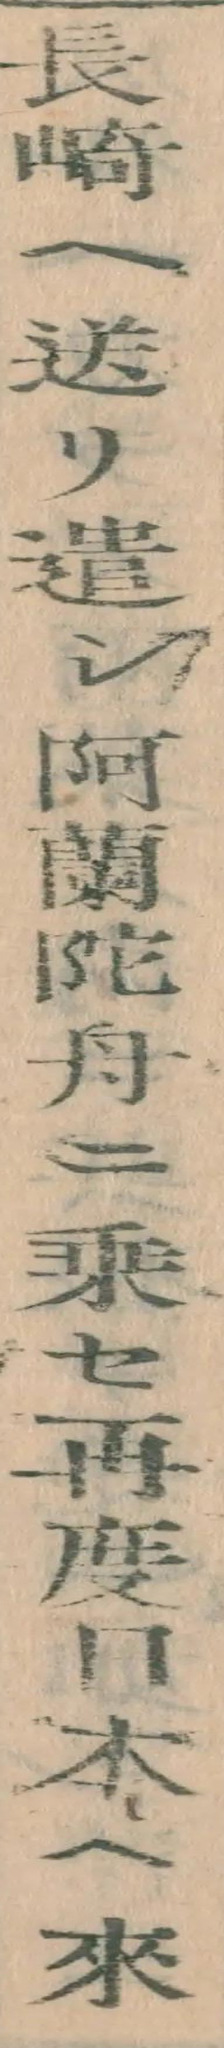長崎ヘ送リ遣シ阿蘭陀舟ニ乗セ再度日本ヘ来
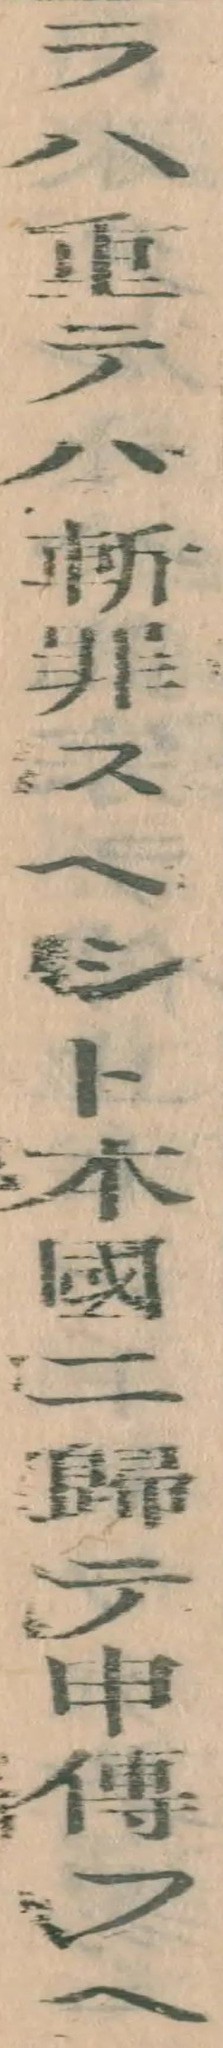ラハ重テハ斬罪スヘシト本国ニ帰テ申伝フヘ
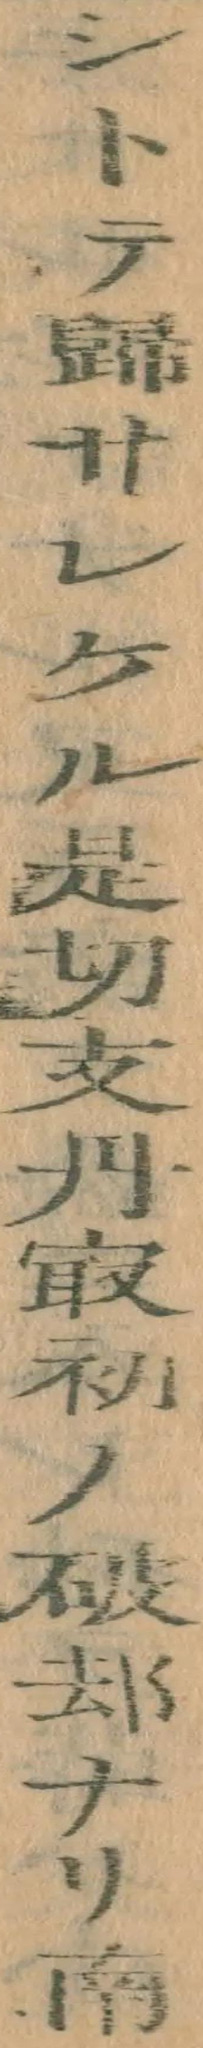シトテ帰サレケル是切支丹最初ノ破却ナリ南
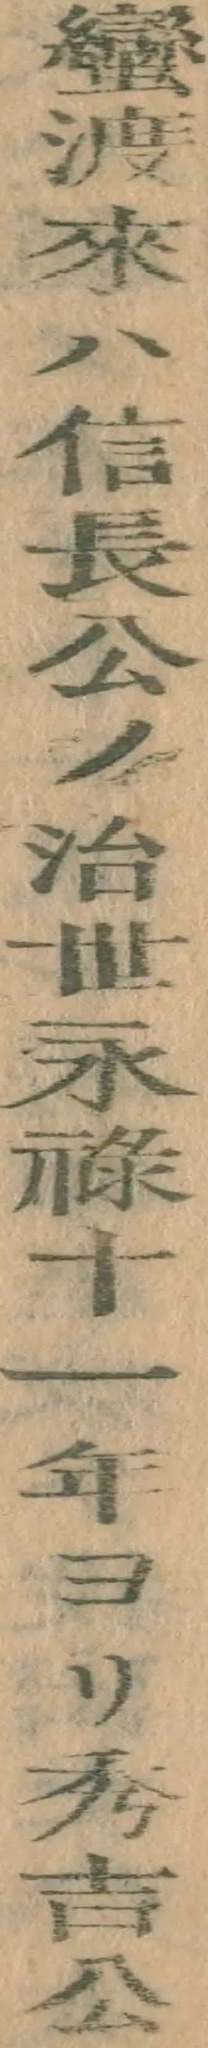蛮渡来ハ信長公ノ治世永禄十一年ヨリ秀吉公
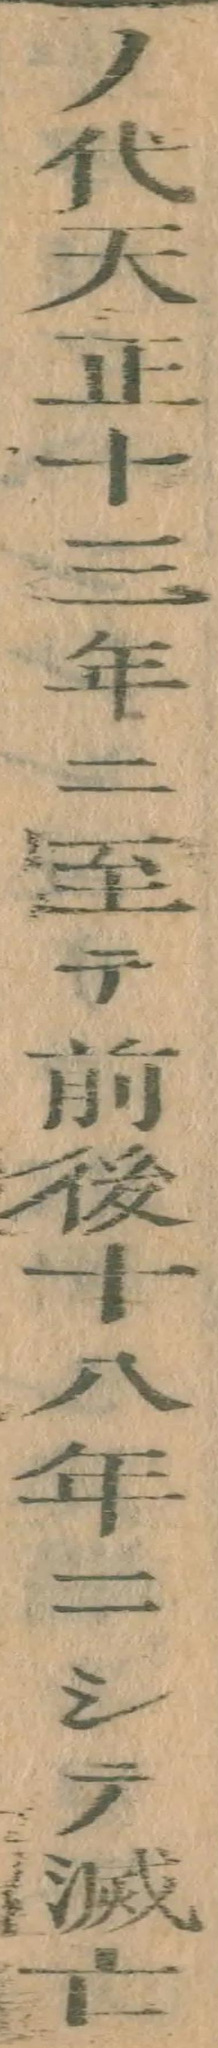ノ代天正十三年ニ至テ前後十八年ニシテ滅亡
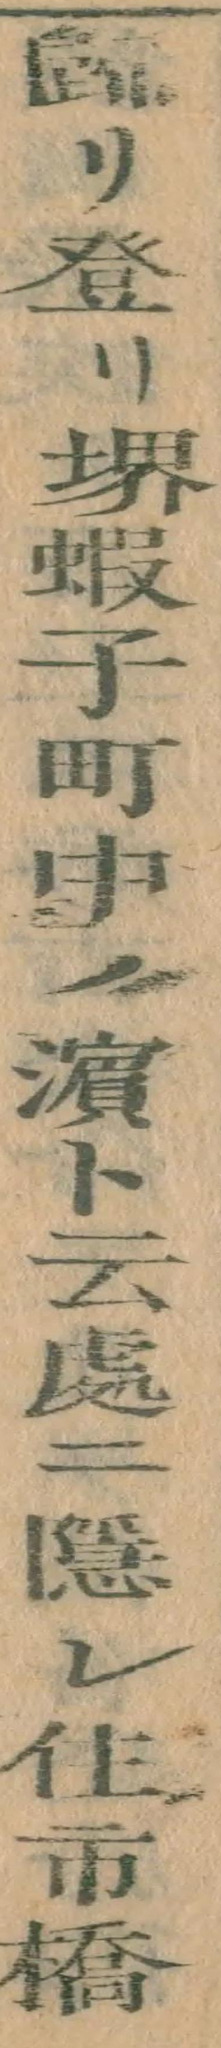帰リ登リ堺蝦子町中ノ浜ト云処ニ隠レ住市橋
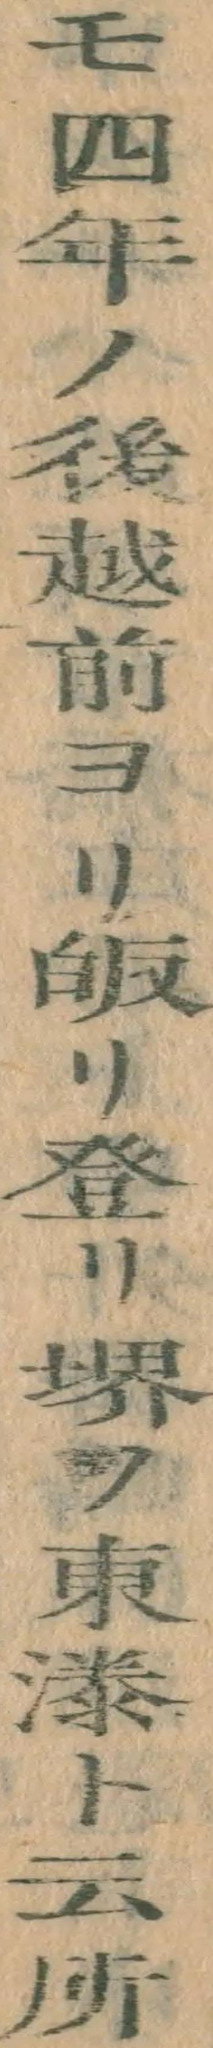モ四年ノ後越前ヨリ帰リ登リ堺ノ東漛ト云所
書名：南蛮寺興廃記
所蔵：国立国会図書館 National Diet Library, JAPAN
